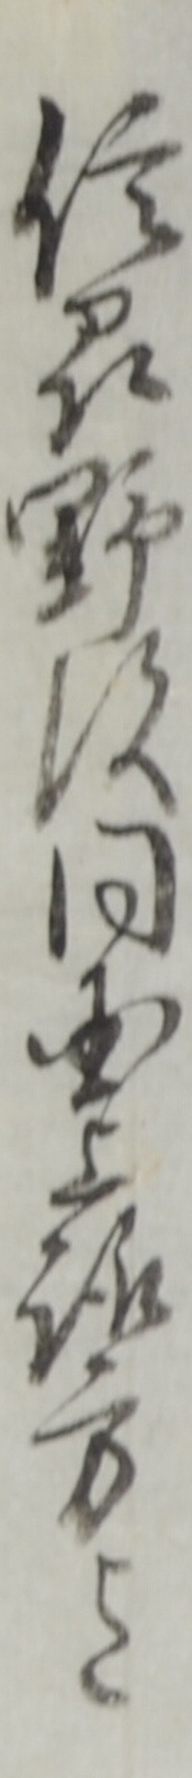信州野沢同国上諏方迄
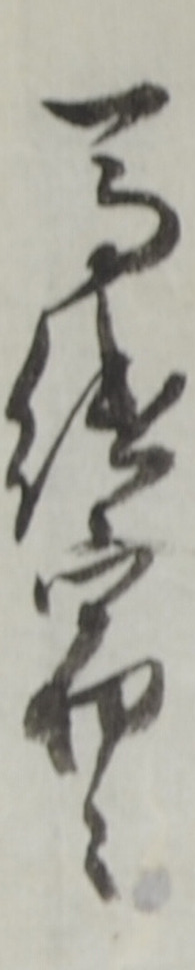馬継宿々
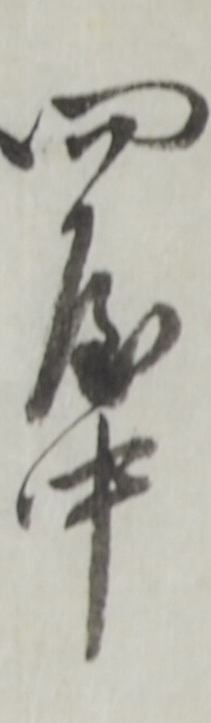問屋中
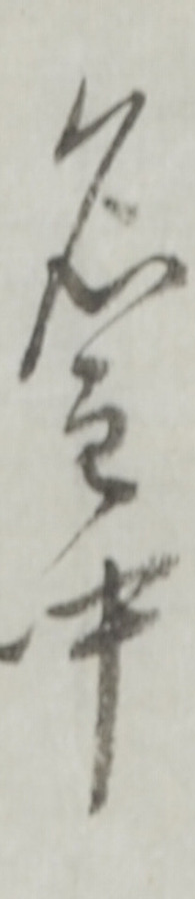名主中

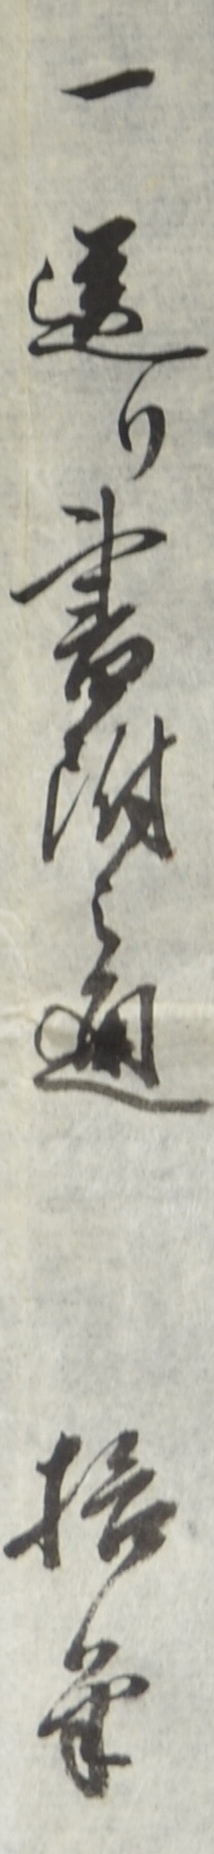一送り書附之通拾筆
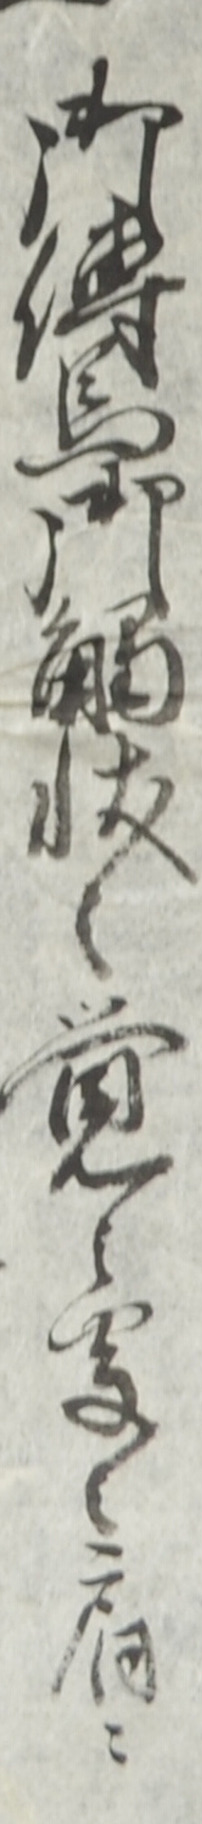御伝馬御触状之覚之処々肩ニ
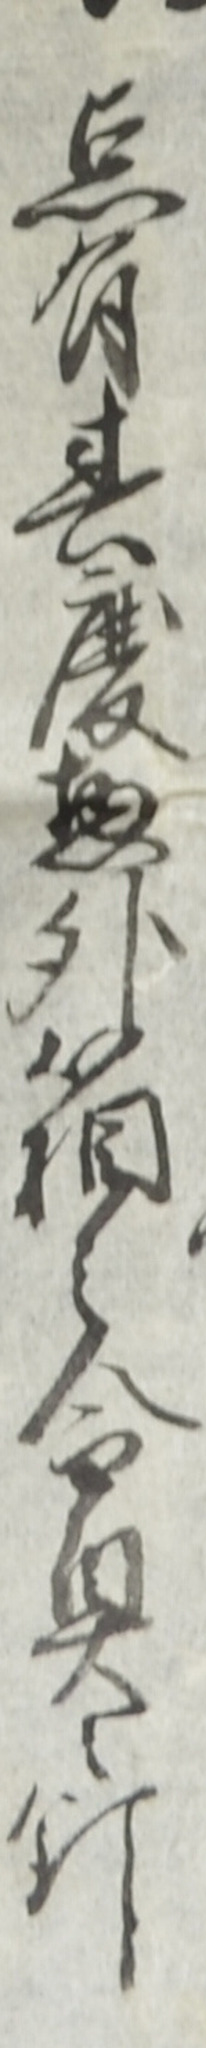但点有其度惣外箱之金具之釘
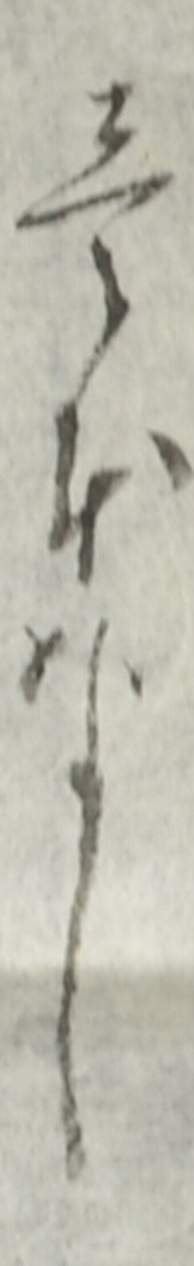壱本なし
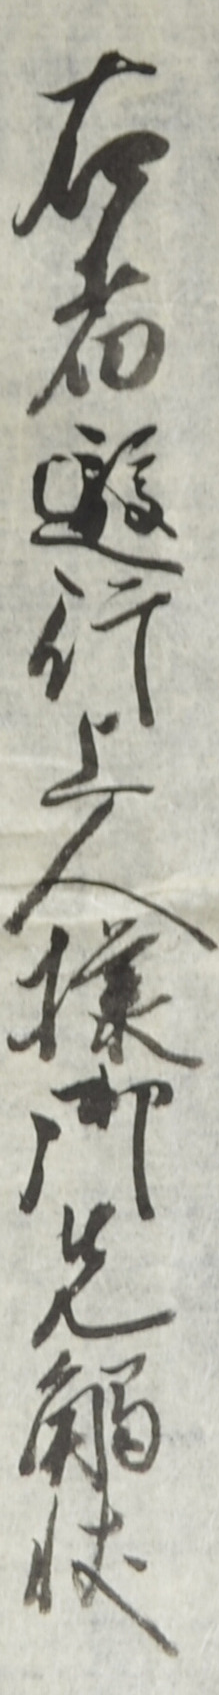右者遊行上人様御先触状
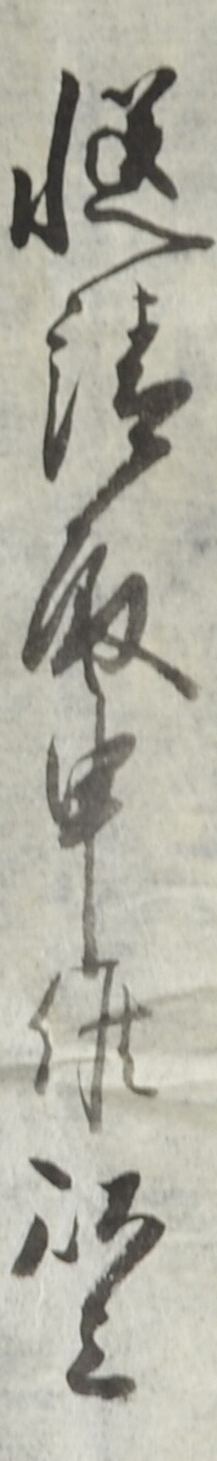慥請取申候以上
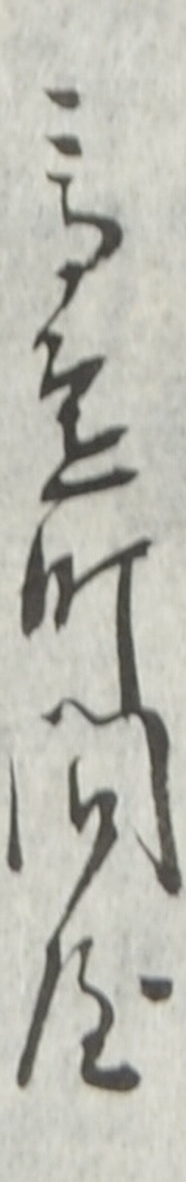高遠町問屋
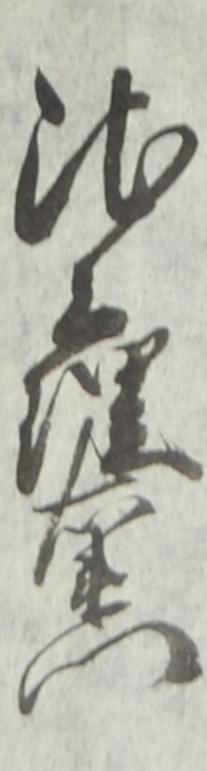池上理右衛門
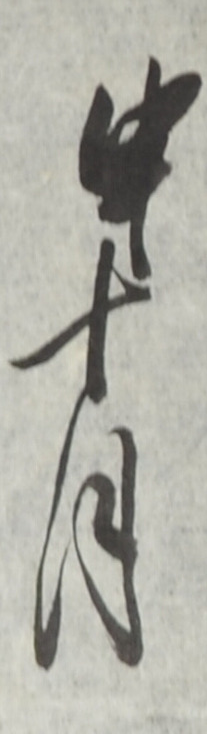申十月
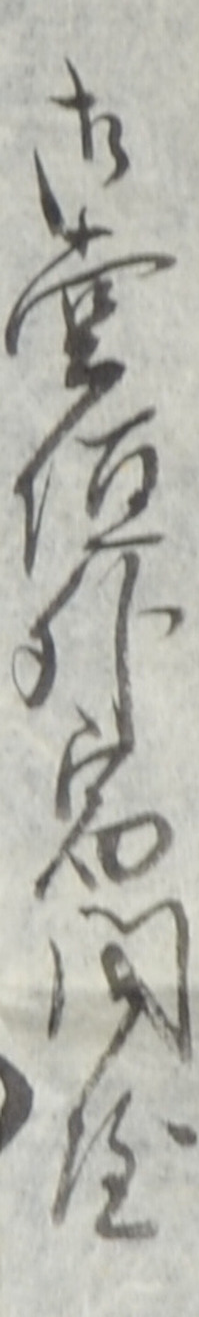御堂垣外宿問屋
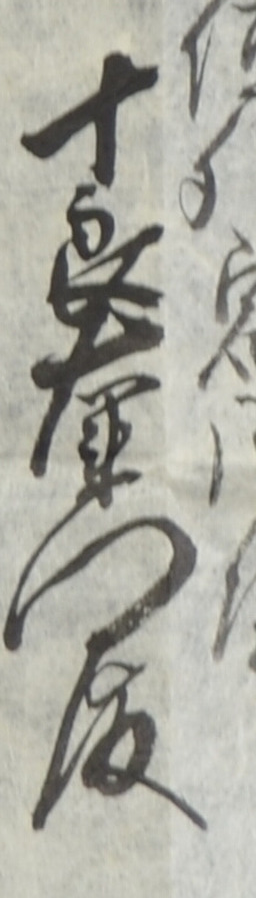十良右衛門殿
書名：（書状）
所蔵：伊那市立高遠町図書館・合同会社AMANE
